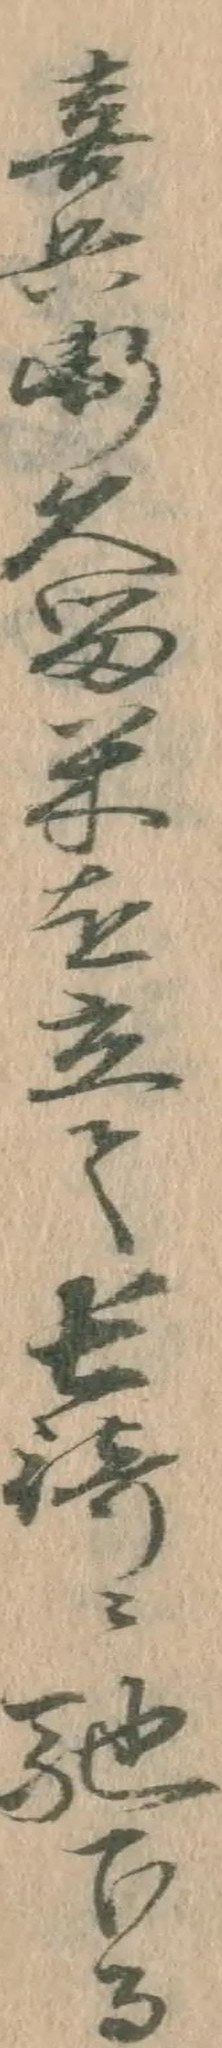喜兵衛久留米を立て長崎に馳下る
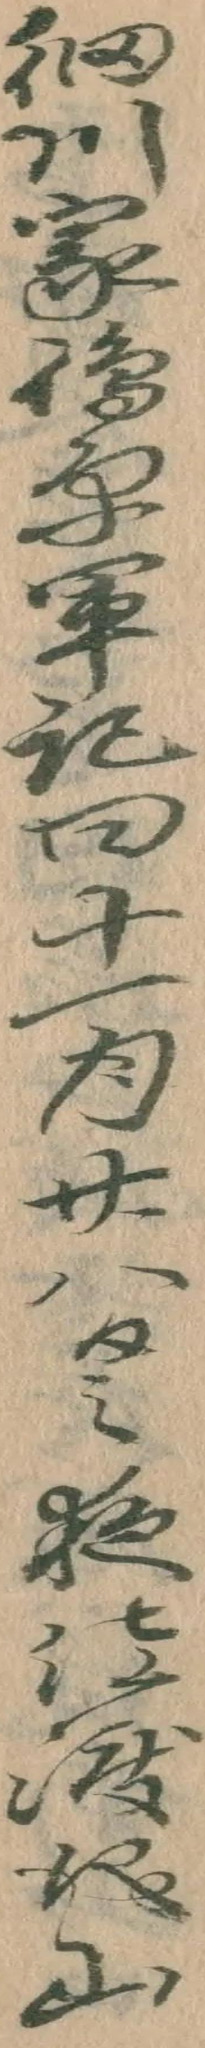細川家島原軍記曰十一月廿八日之夜佐渡儀山
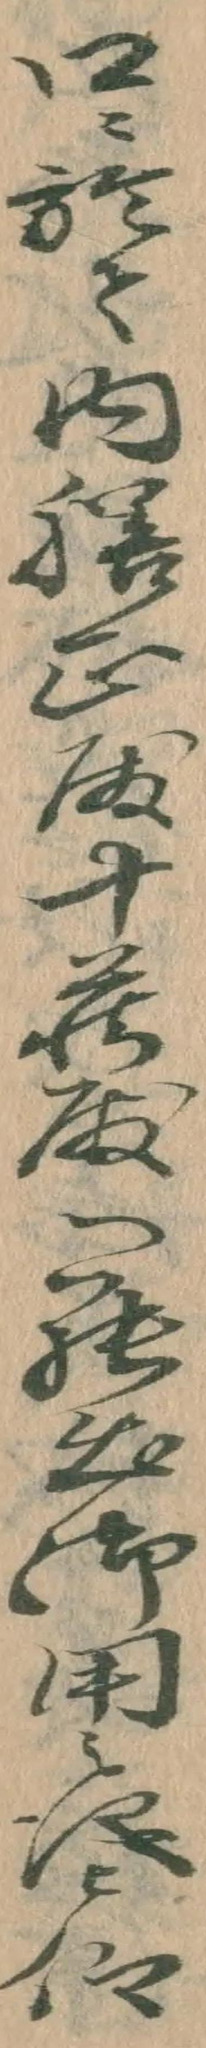口に於て内膳正殿十蔵殿へ罷出御用之儀被仰
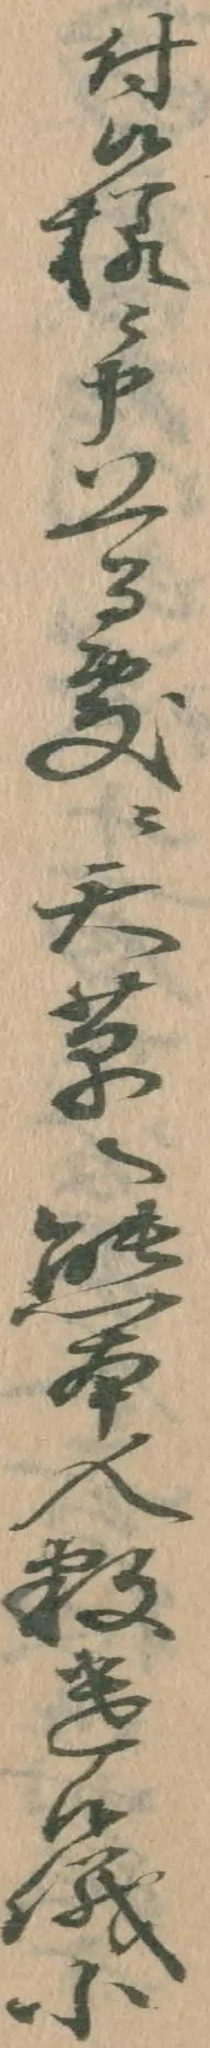付候様に申上る処に天草へ熊本人数遣候儀小
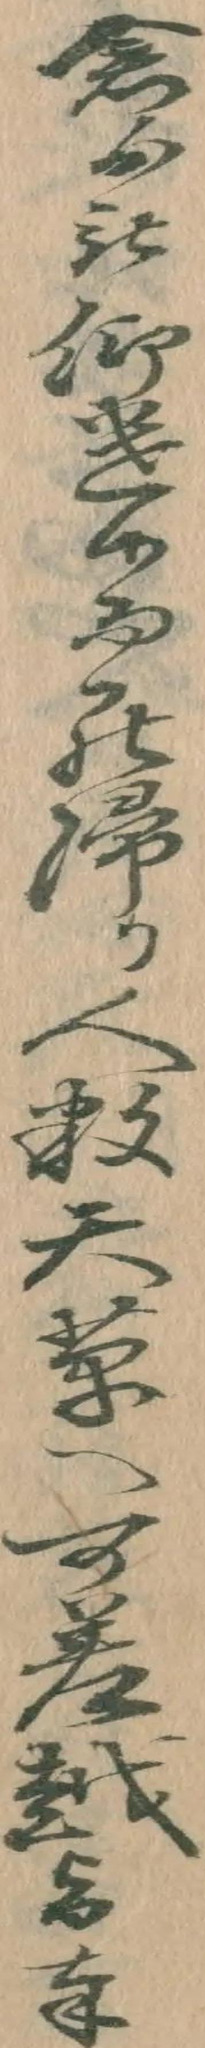倉ゟ被仰遣候而罷帰り人数天草へ可差越旨奉
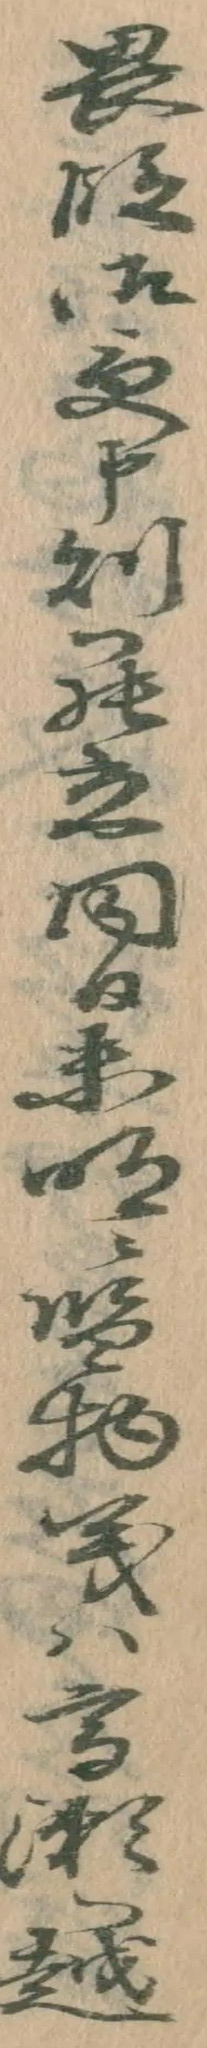畏段御受申則罷立同日未明に監物義は高瀬へ越
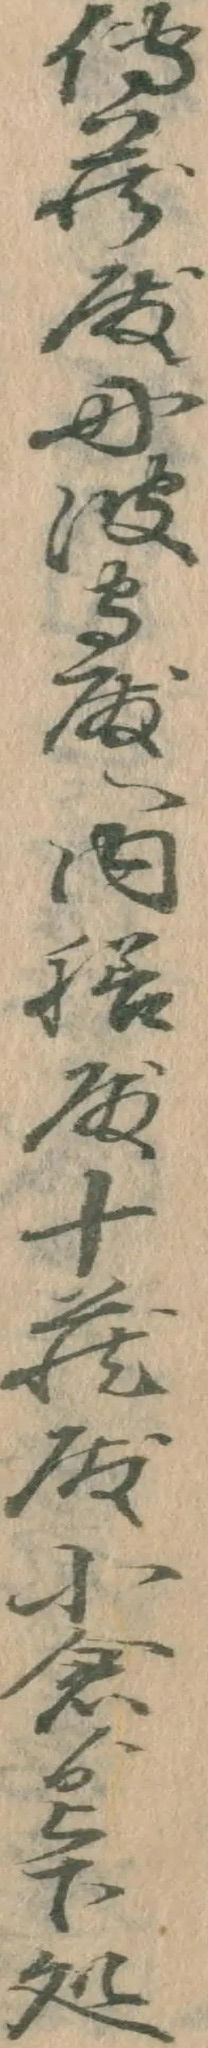伝蔵殿丹波守殿へ内膳殿十蔵殿小倉ゟ被下処
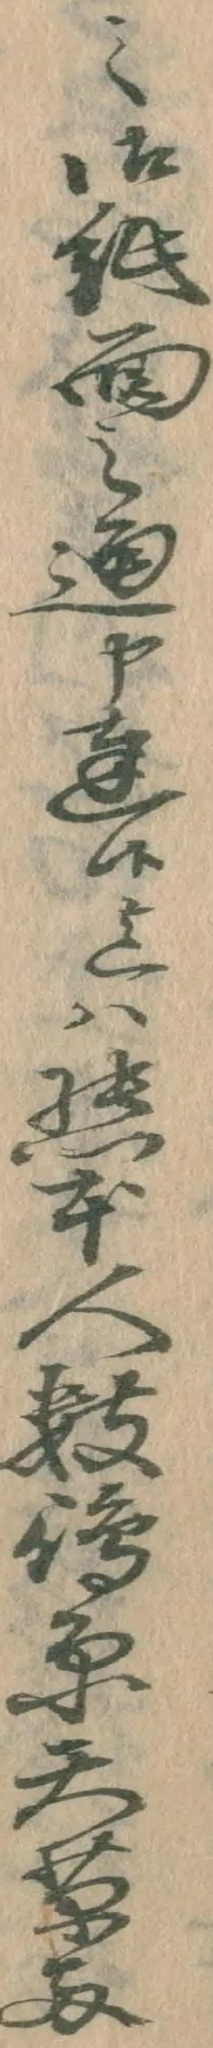之御紙面之通申達候迄は熊本人数島原天草両
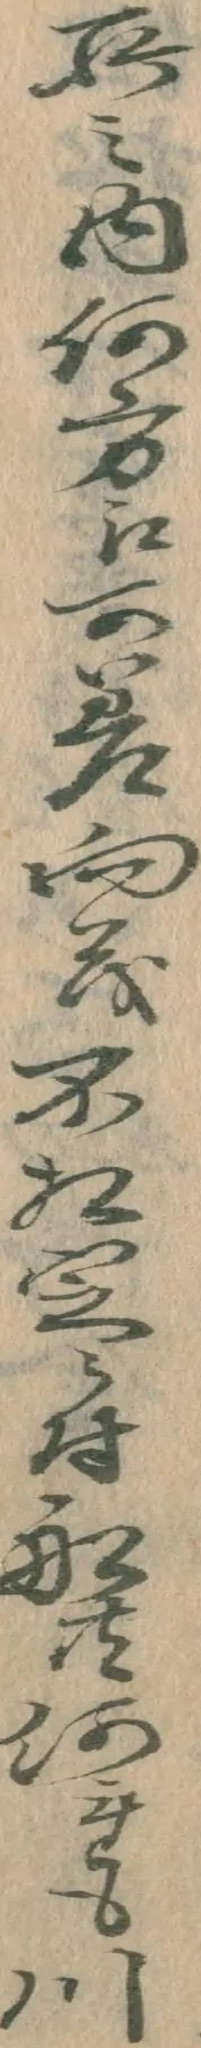所之内何方江可差向も不相定に付船共何れも川
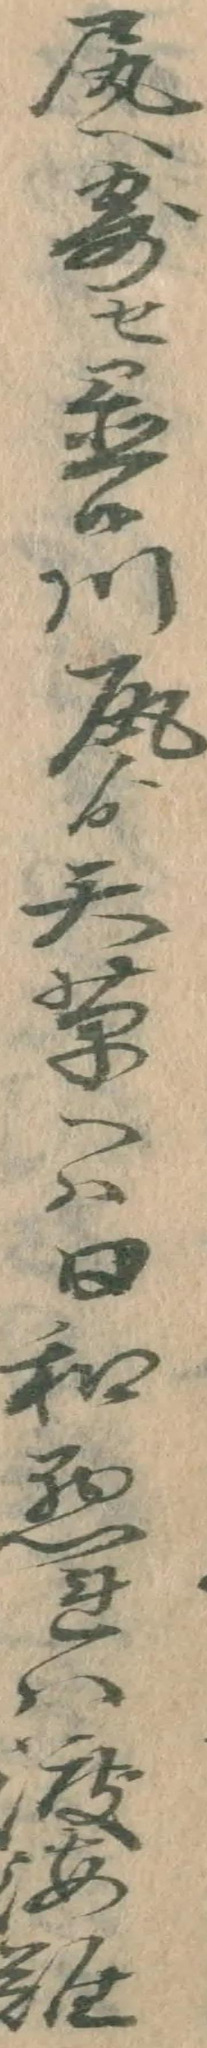尻へ寄セ置候川尻ゟ天草へは日和悪れは渡海難
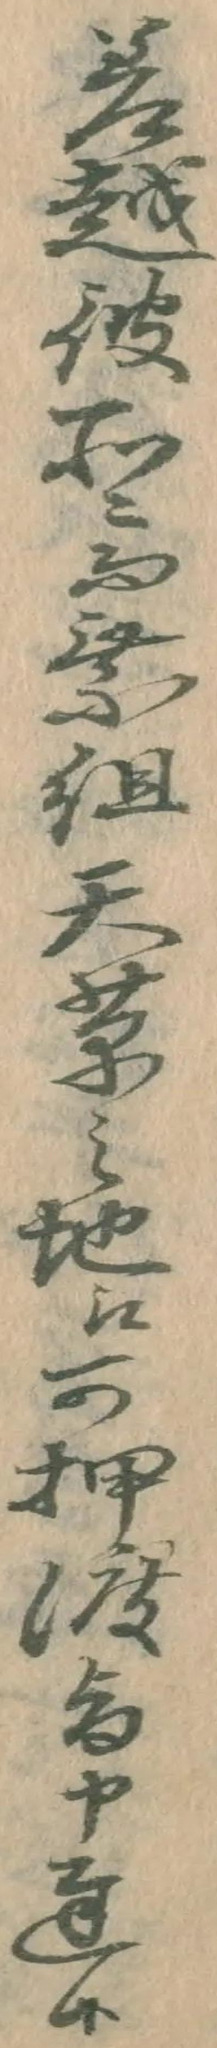差越彼所に而乗組天草之地江可押渡旨申達候
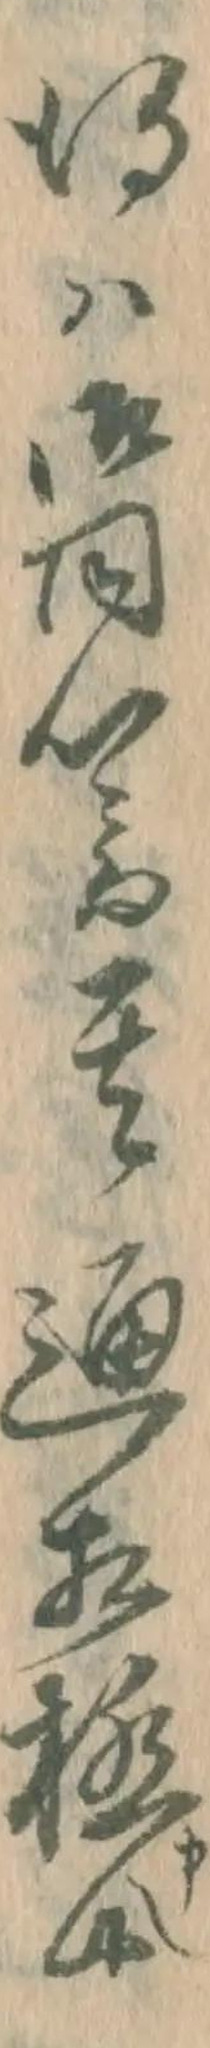得は御同心に而其通相極候

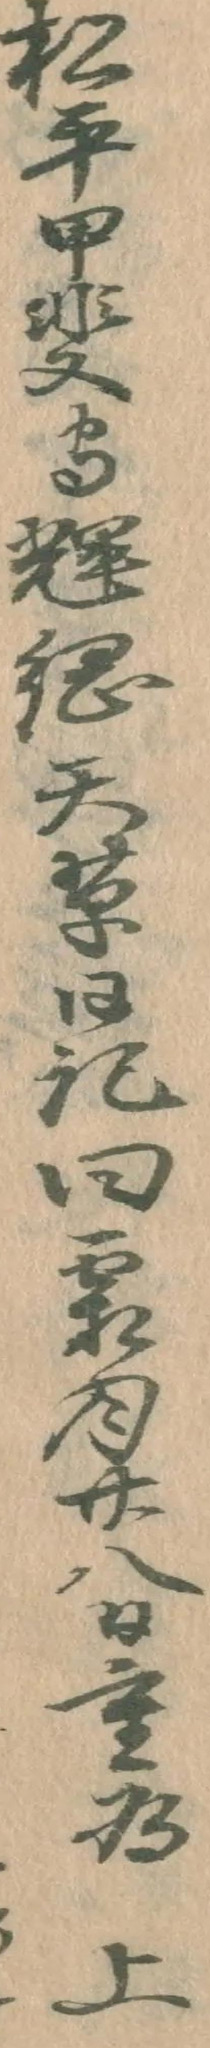松平甲斐守輝綱天草日記曰霜月廿八日重為上
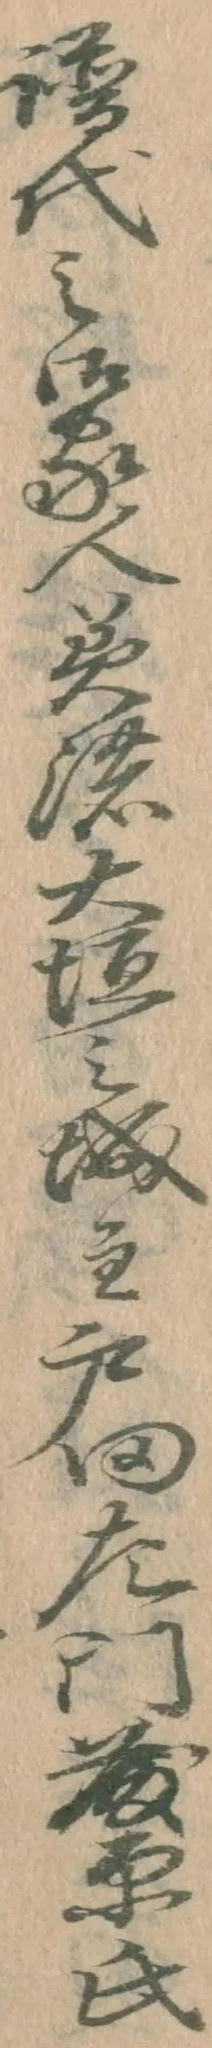譜代之御家人美濃大垣之城主戸田左門藤原氏
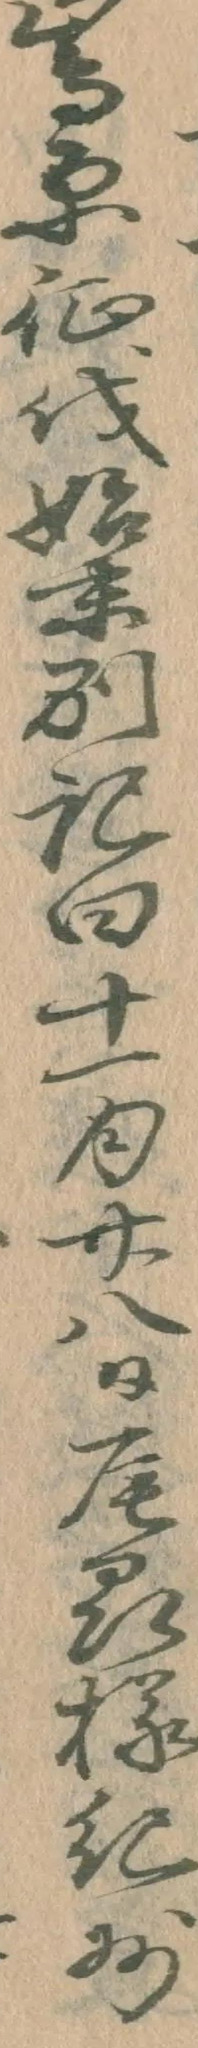島原征伐始末別記曰十一月廿八日尾州様紀州
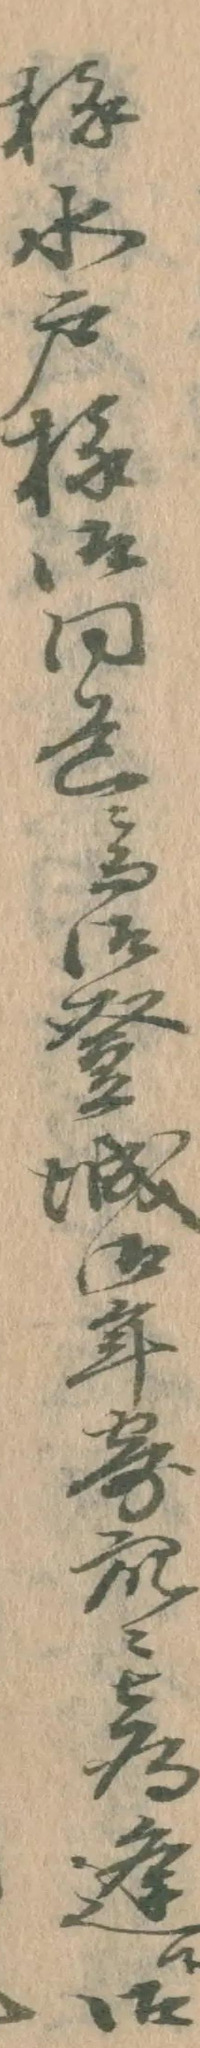様水戸様御同道に而御登城御年寄衆に被為逢候御
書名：切支丹御退治記 49巻. [3]
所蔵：国立国会図書館 National Diet Library, JAPAN
